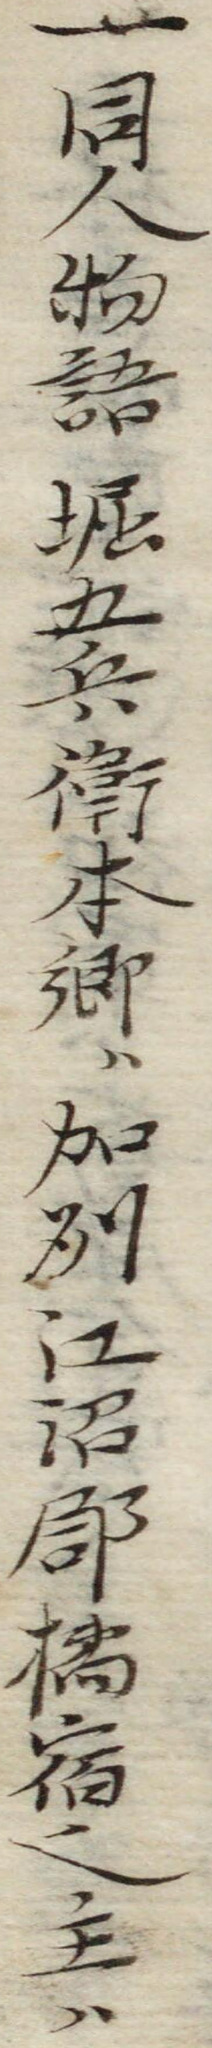同人物語堀五兵衛本郷ハ加州江沼郡橋宿也主ハ

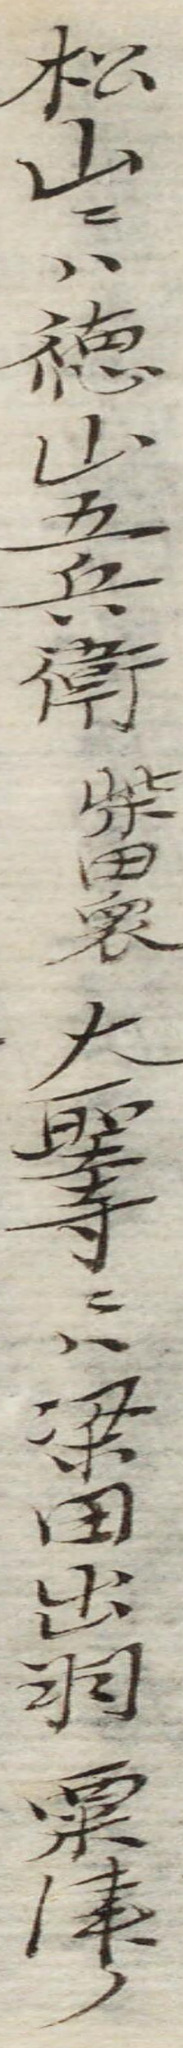松山ニハ徳山五兵衛柴田衆大聖寺ニハ梁田出羽粟津ノ
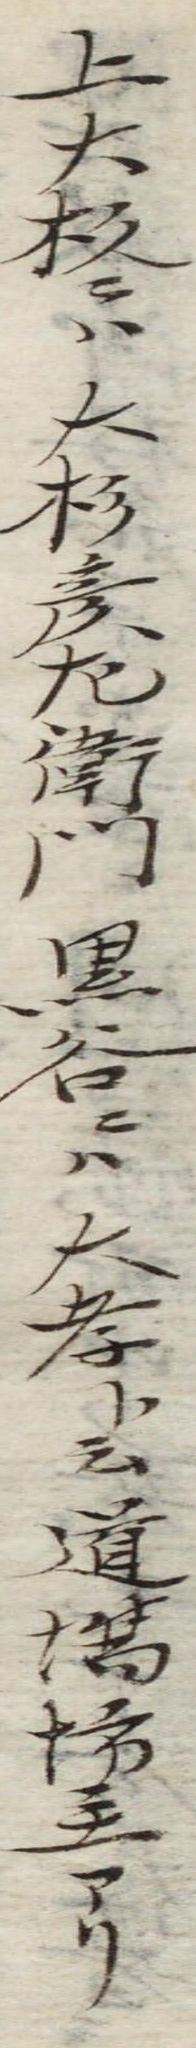上大杉ニハ大杉彦左衛門黒谷ニハ大孝ト云道橋坊主アリ
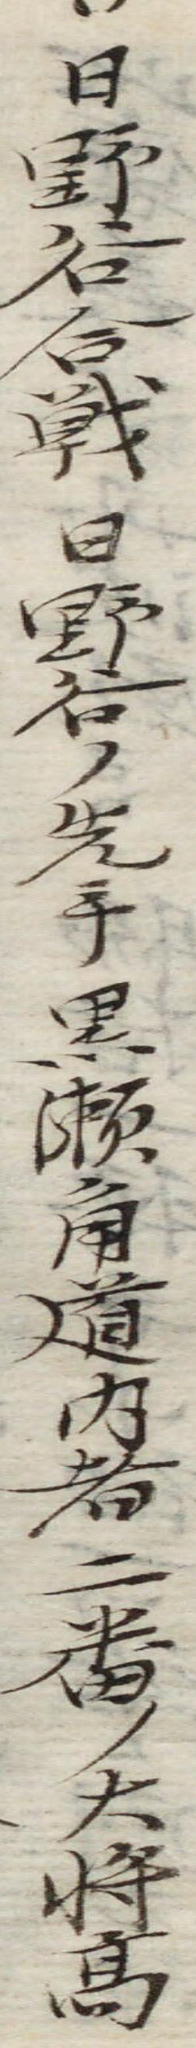〇日野谷合戦日野谷ノ先手黒瀬角道内者二番ノ大将高
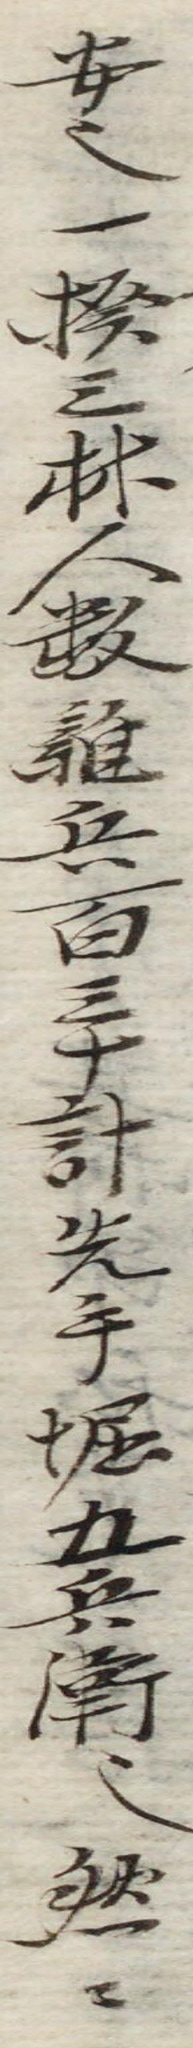安也一揆三林人数雑兵百三十計先手堀五兵衛也然ニ
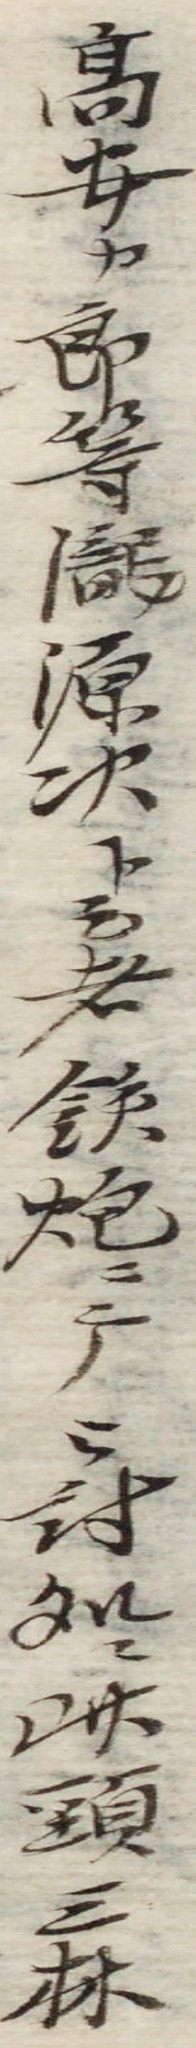高安カ郎等瀧源次ト云者鉄炮ニテ討処ニ此頭三林
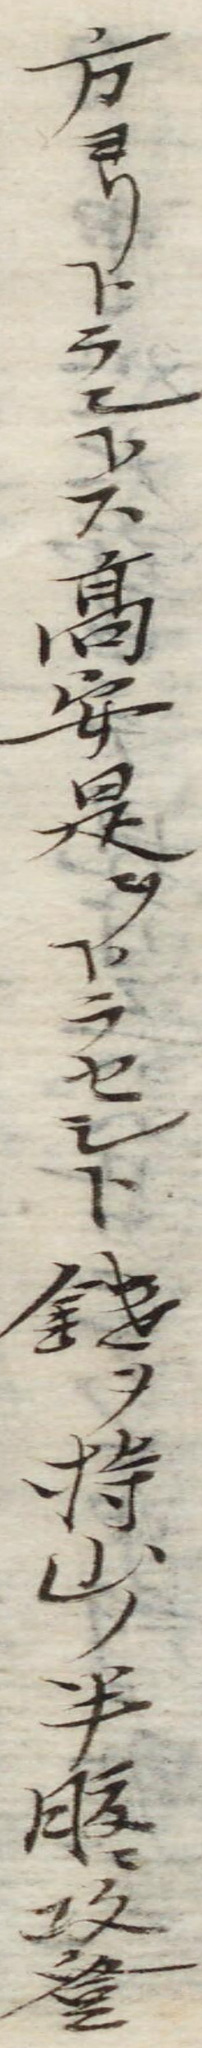方ヨリ下ラシ下ス高安是ヲ下ラセシト鑓ヲ持山ノ半腹ニ攻登
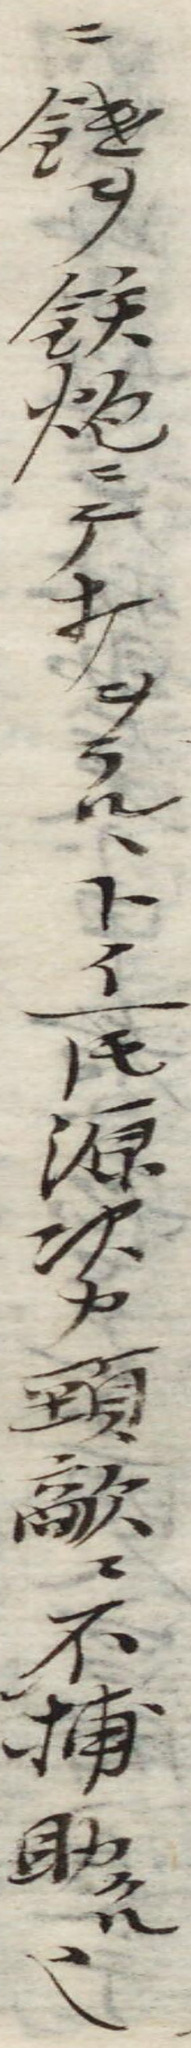ニ鑓ヲ鉄炮ニテ打ヲラルヽトイへトモ源次カ頭敵ニ不捕助ラル也
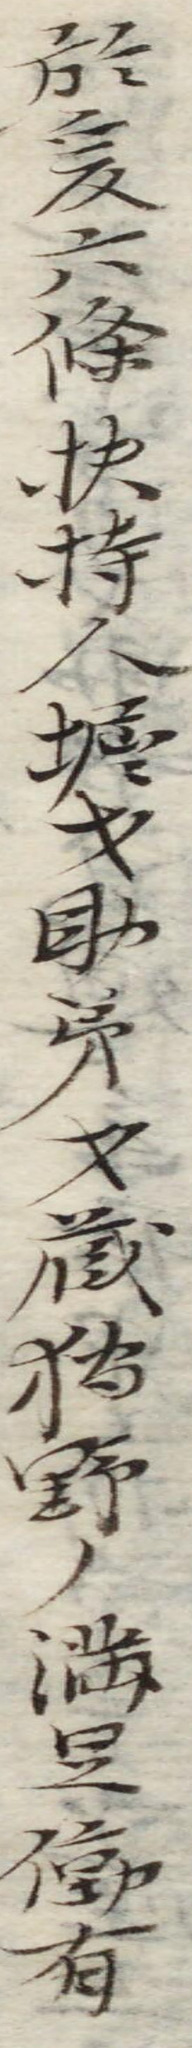於爰六條扶持人堀才助弟才蔵狩野ノ満足働有
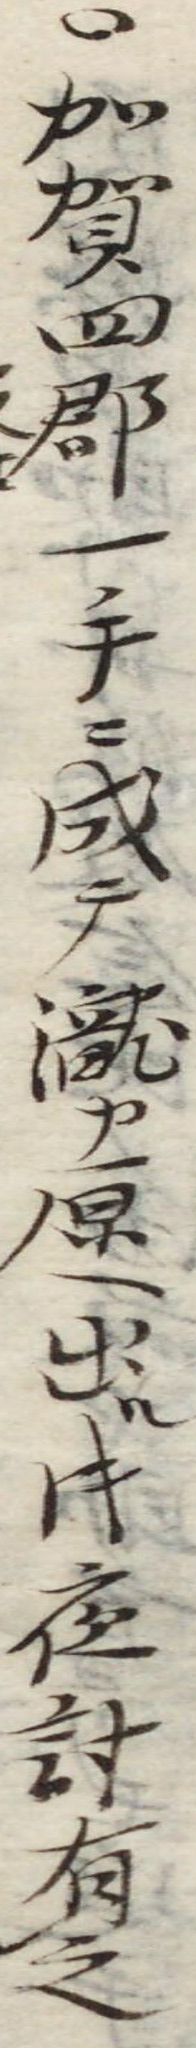〇加賀四郡一手ニ成テた瀧カ原ヘ出ルトキ夜討有之
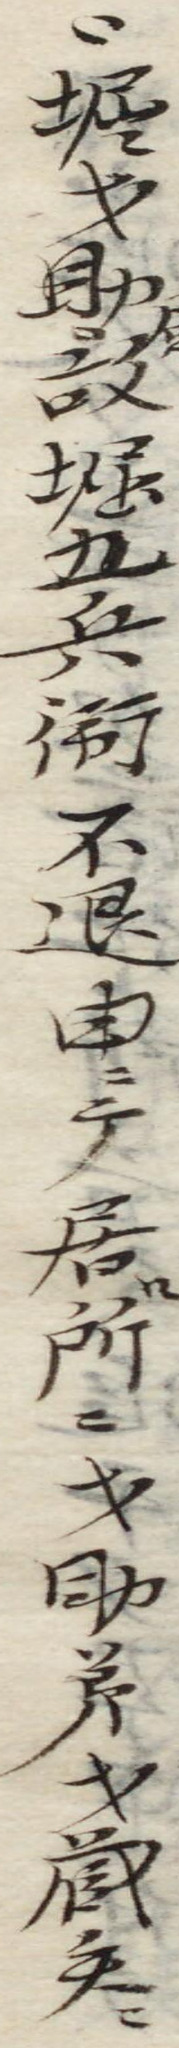〇堀才助〇故堀五兵衛不退由ニテ居ル所ニ才助弟才蔵矢ニ
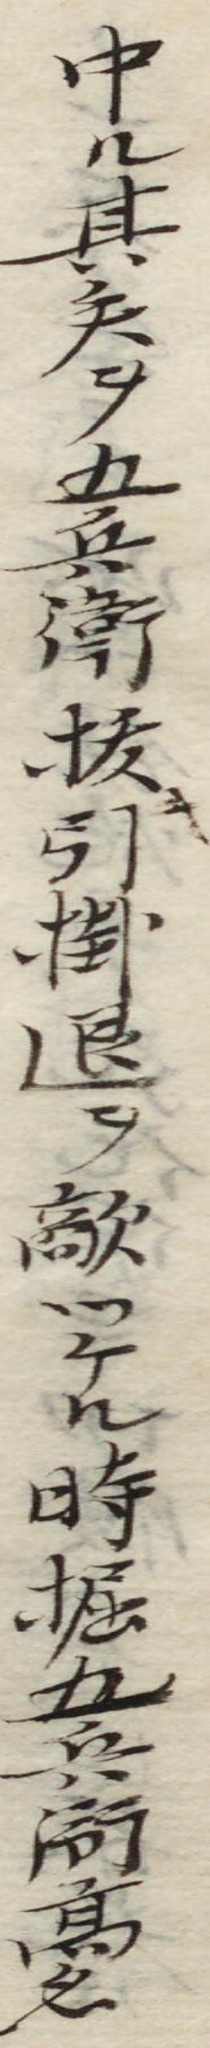中ル其矢ヲ五兵衛抜キ引掛退ヲ歊ツケル時堀五兵衛高名
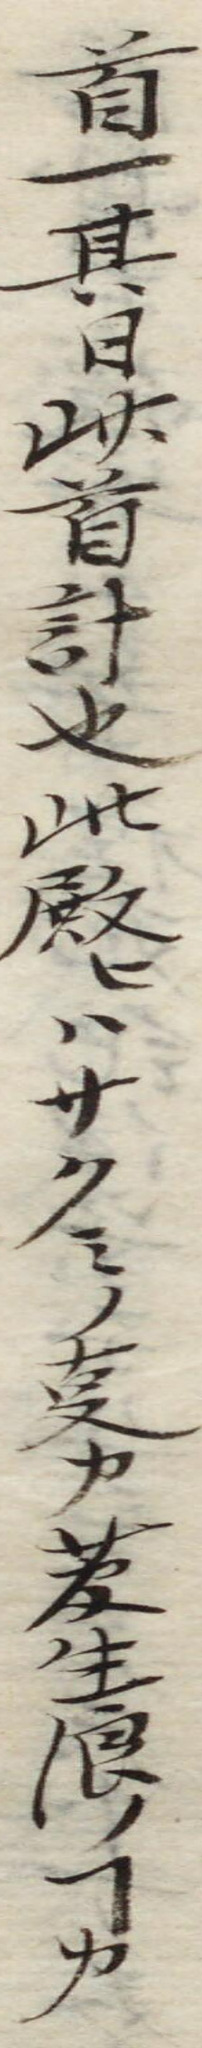首一其日此首計也此殿ヒハサクミノ事カ芨生俍ノ事カ
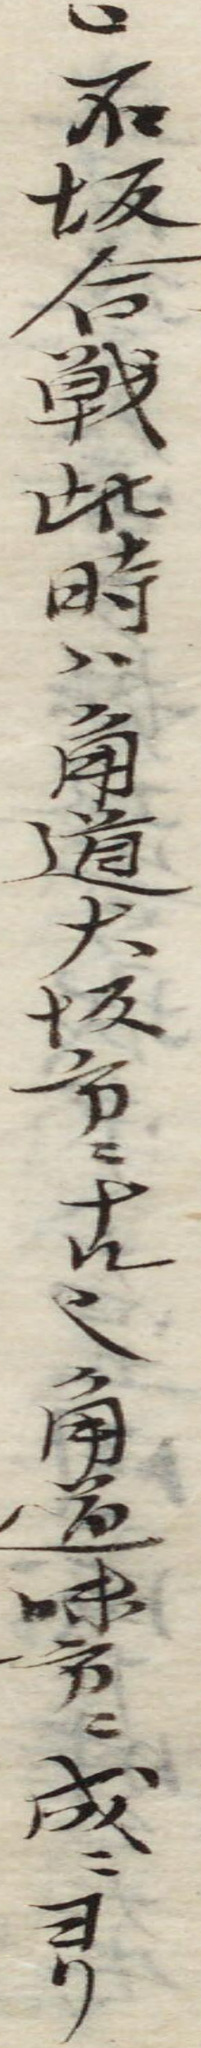〇石坂合戦此時は角道大阪方二ナル也角道味方二成二ヨリ
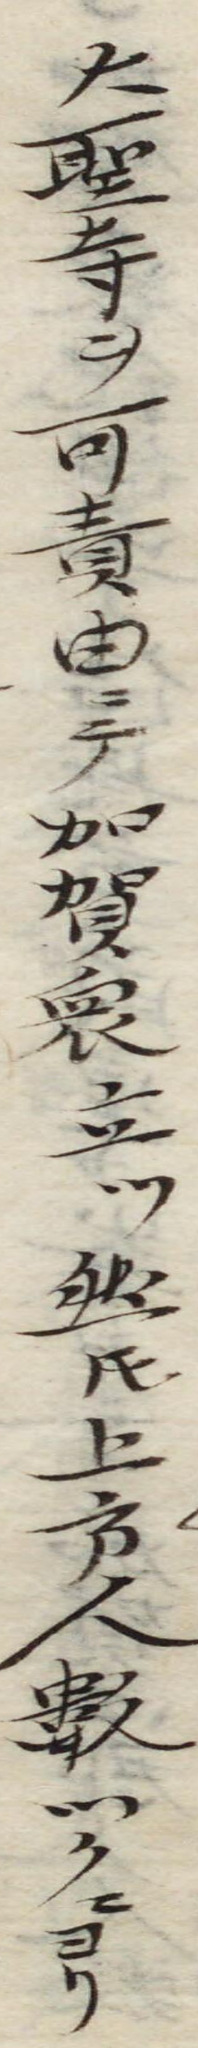大聖寺ヲ可責由ニテ加賀衆立ツ然トモ方人数ツク二ヨリ
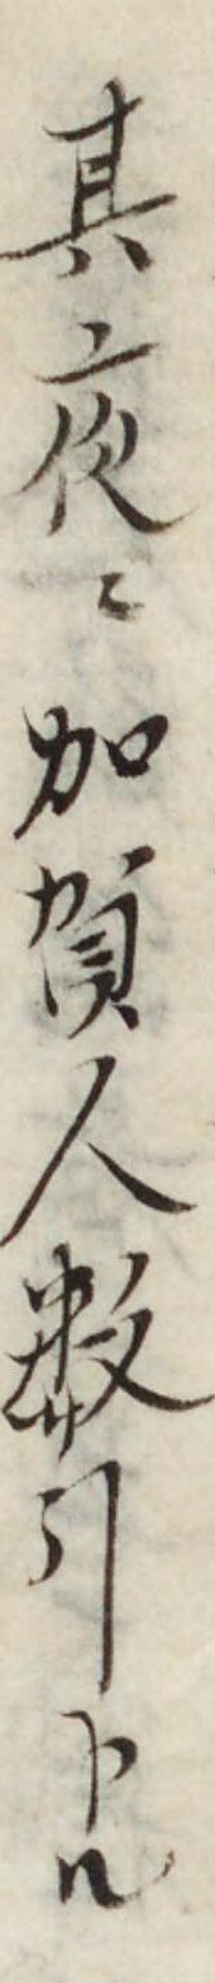其夜二加賀人数引下ル
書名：聞見雑録
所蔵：Ishikawa Prefectural Library
